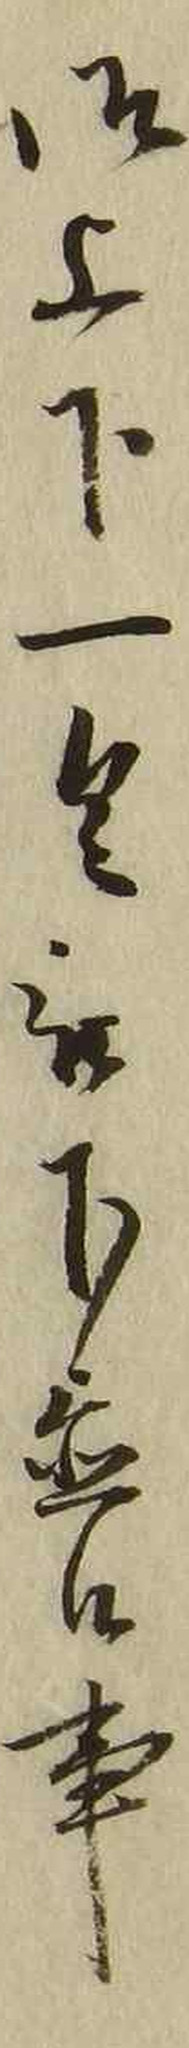御上下一具被下置候事
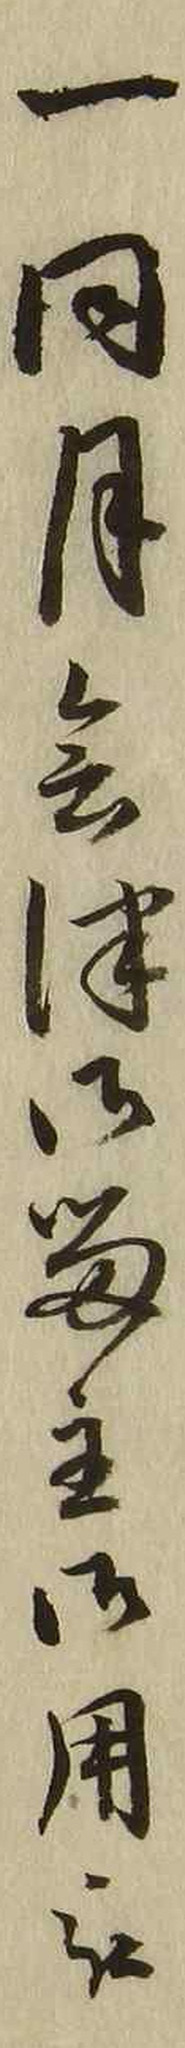一同月会津御留主御用被
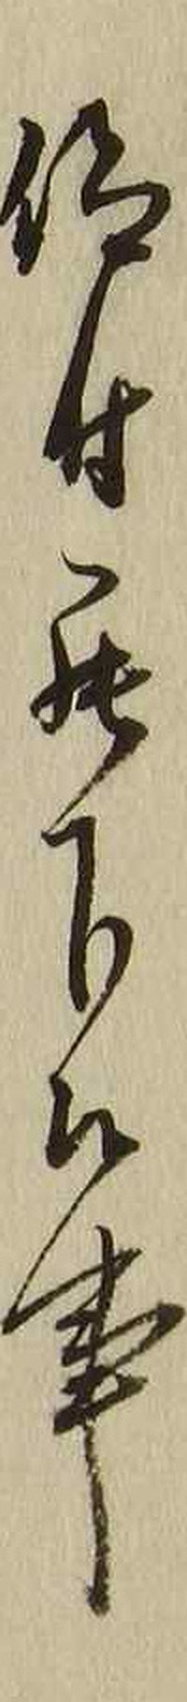仰付罷下候事
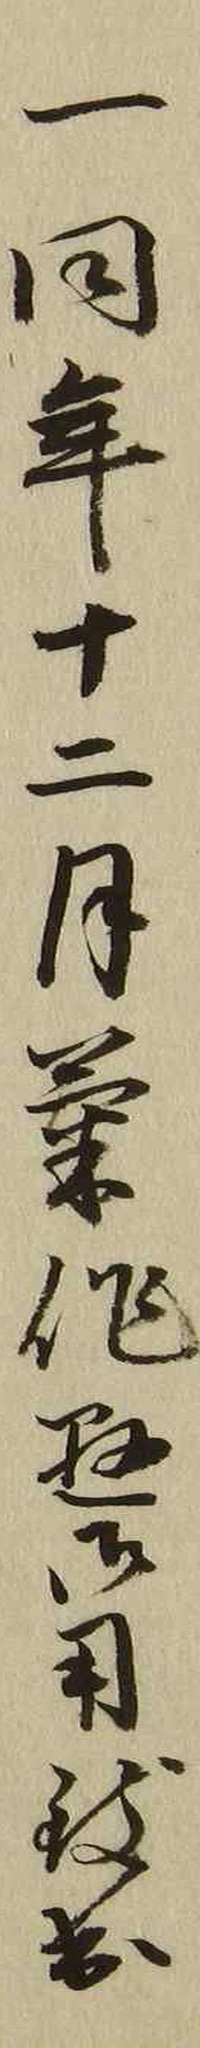一同年十二月菊作懸御用致出
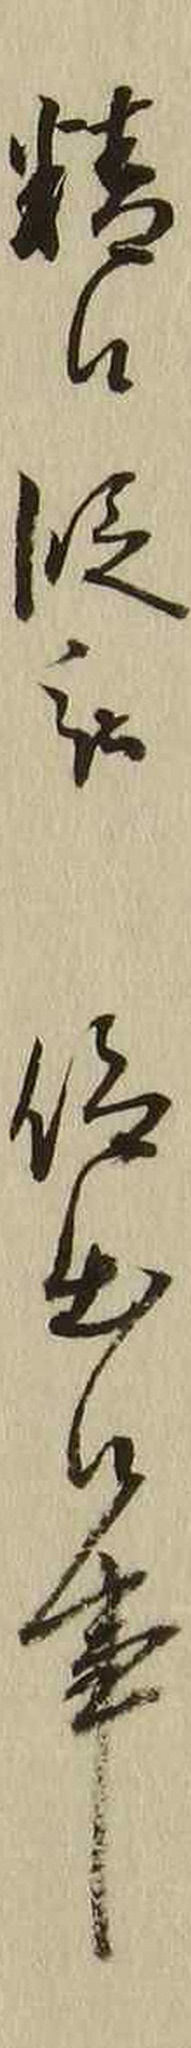精候段被仰出候事
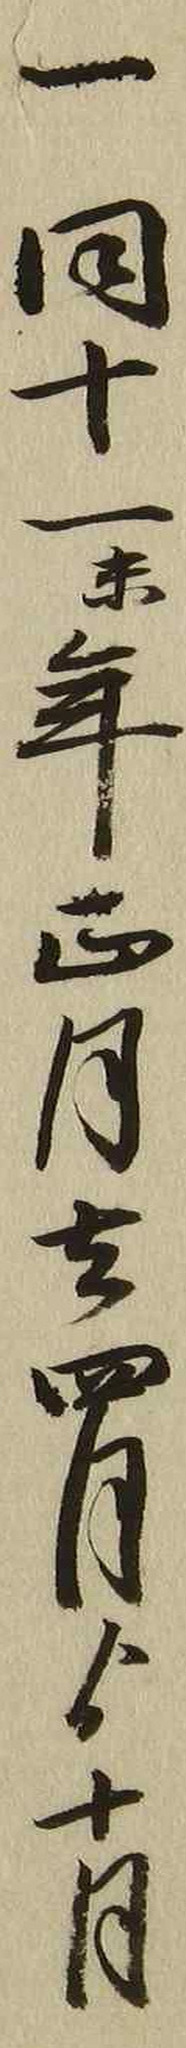一同十一未年正月去四月ゟ十月
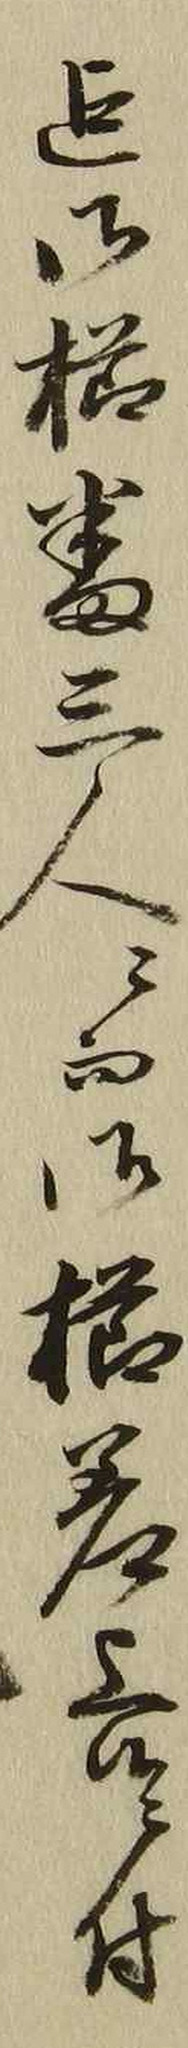迄御櫛番三人ニ而御櫛差上候ニ付
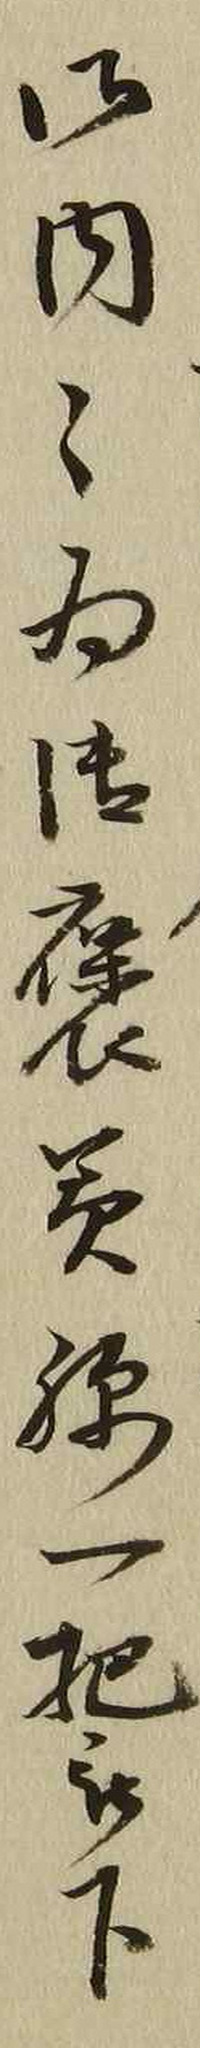御内々為御褒美綿一把被下
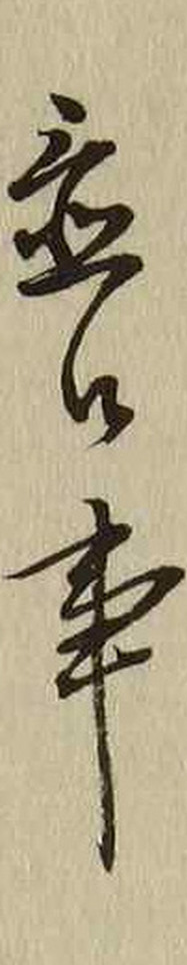置候事
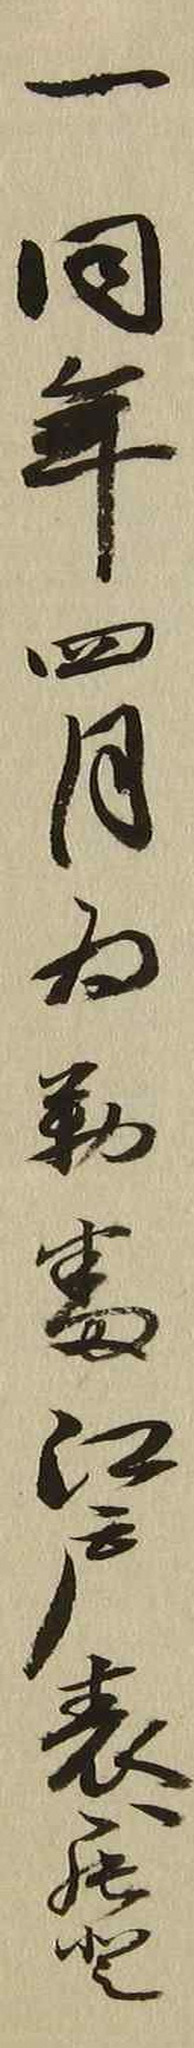一同年四月為勤番江戸表へ罷登
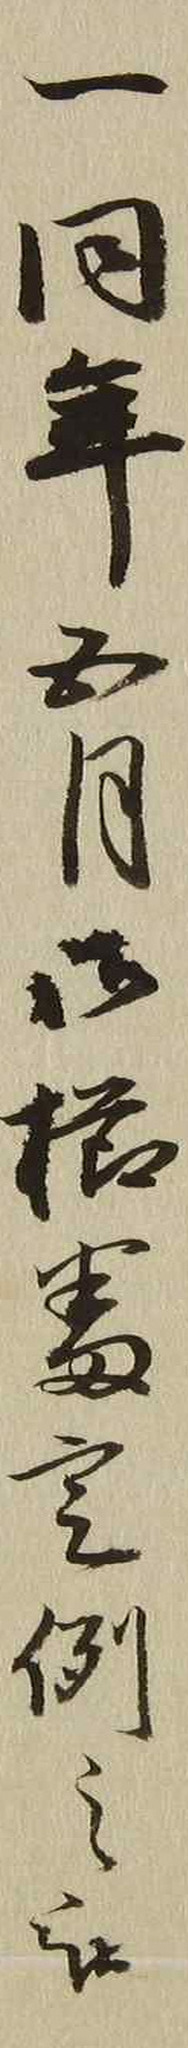一同年五月御櫛番定例之被
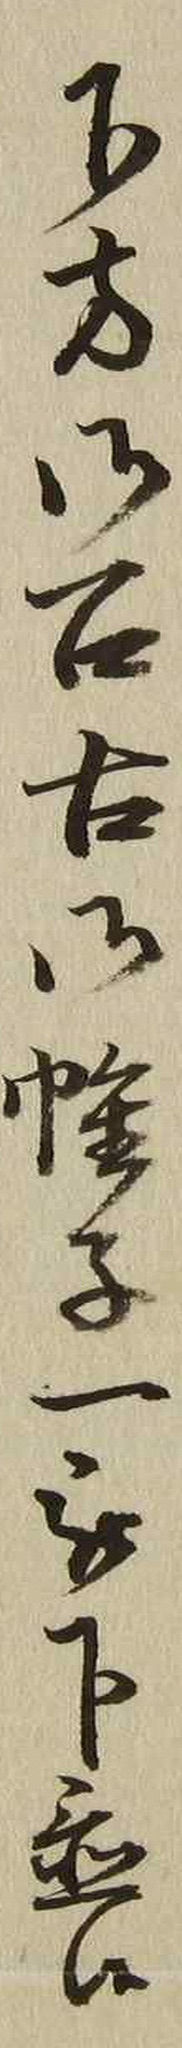下方御召古御帷子一被下置候
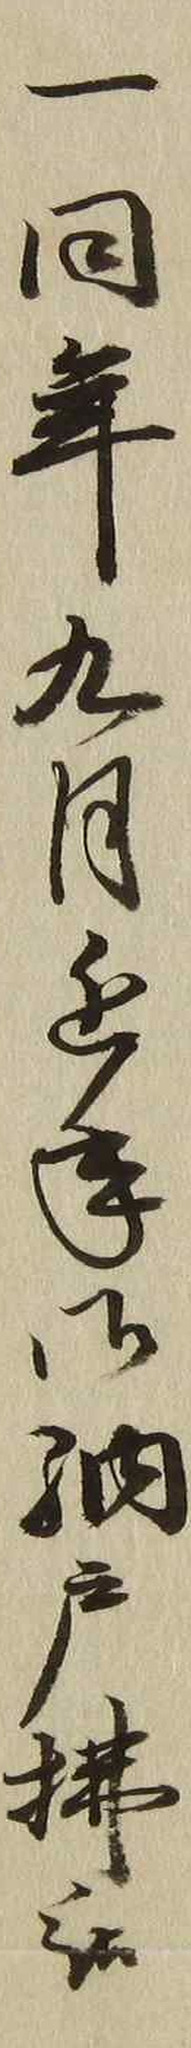一同年九月近年御納戸払被
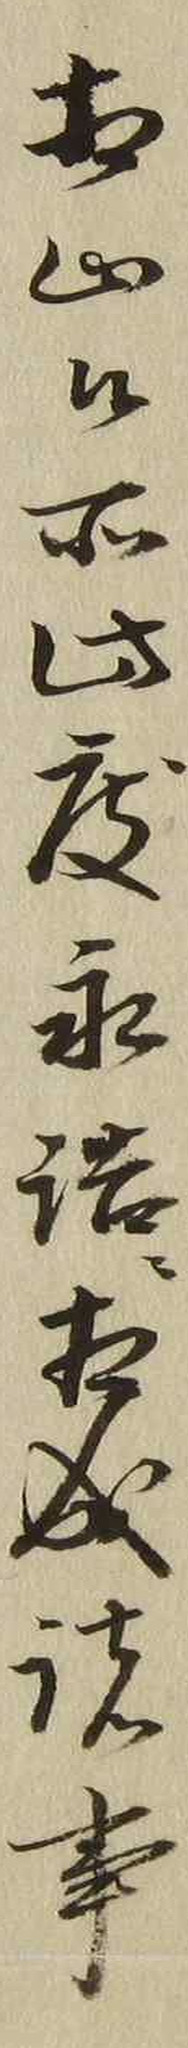相止候所此度永詰ニ相成諸事
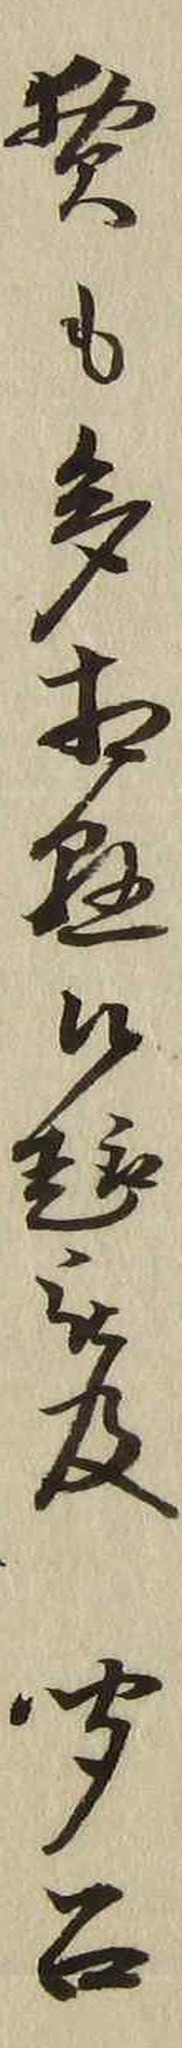費も多相懸候趣被及聞召
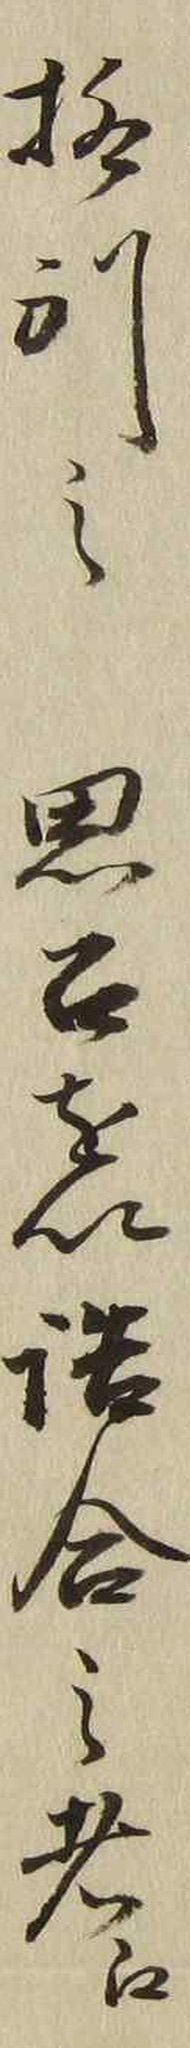格別之思召を以詰合之者江
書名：諸士系譜　巻之61　と之部4
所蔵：会津若松市立会津図書館
